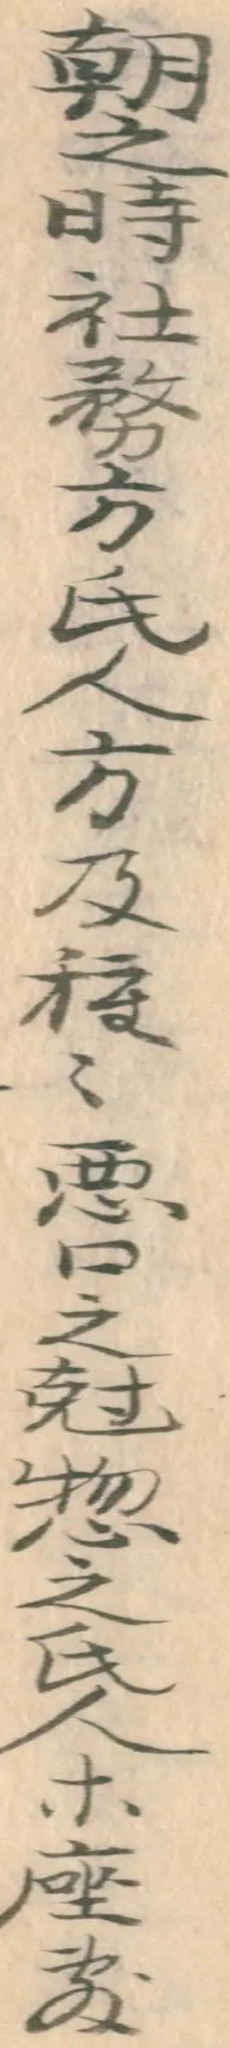朝之時社務方氏人方及種々悪口之尅惣之氏人等座敷
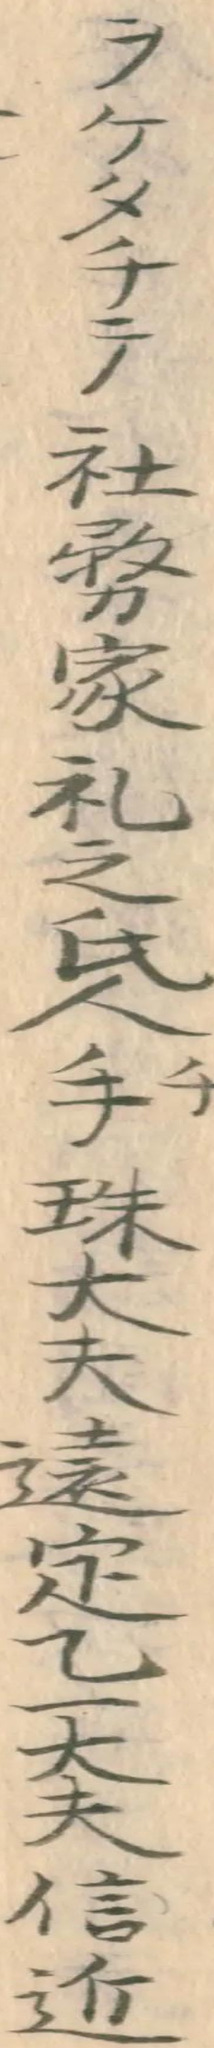ヲケタチテ社務家礼之氏人手珠大夫遠定乙一大夫信近
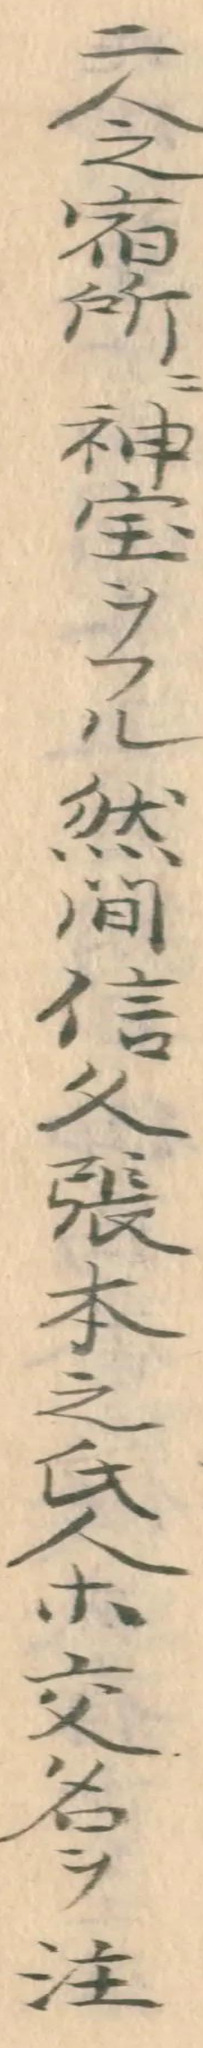ニ令宿所ニ神宝ヲフル然間信久張本之氏人等交名ヲ注
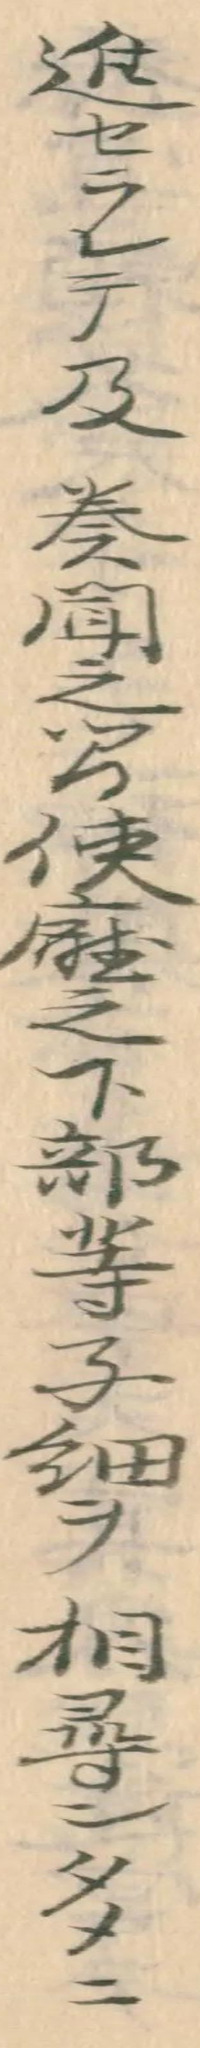進セラレテ及奏聞之間使庁之下部等子細ヲ相尋ンタメニ
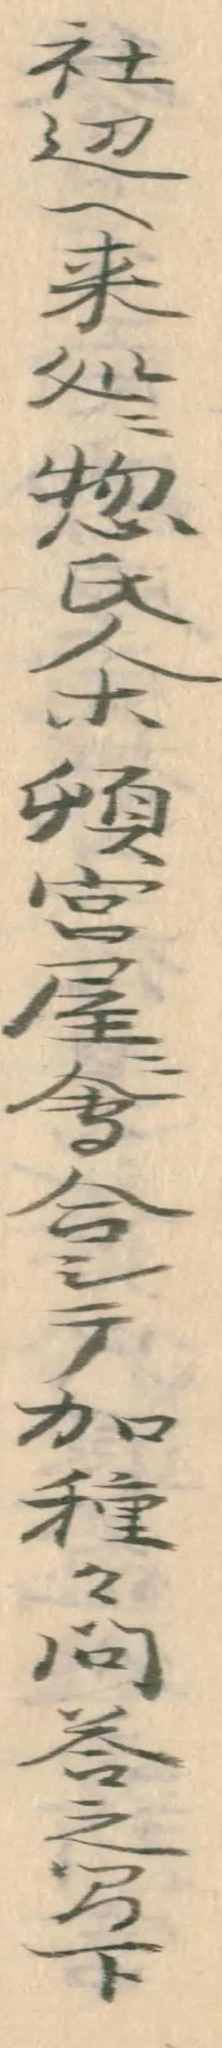社辺ヘ来処ニ惣氏人等頓宮屋ニ会合シテ加種々問答之間下
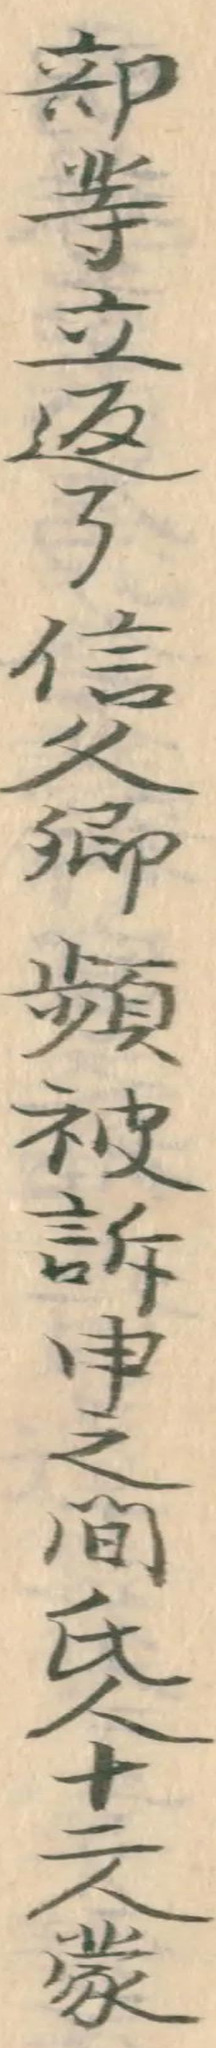部等立返了信久卿頻被訴申之間氏人十二人蒙
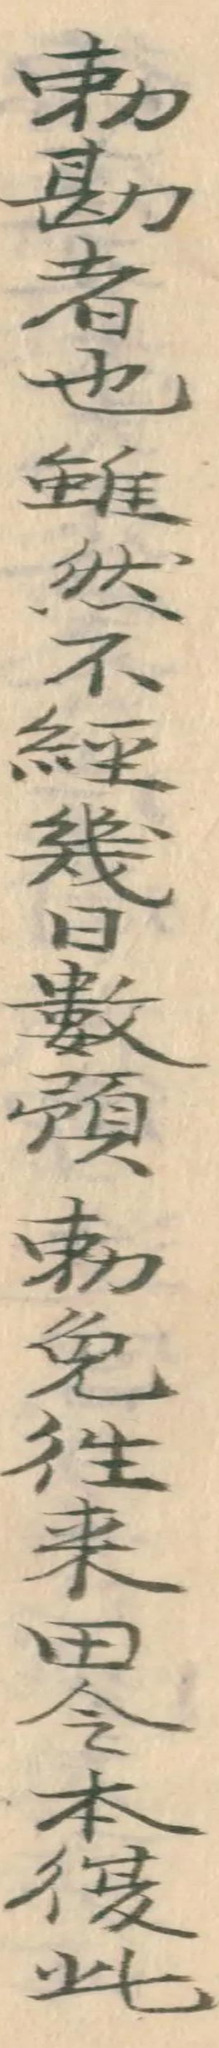勅勘者也雖然不経幾日数預勅免往来田令本復此
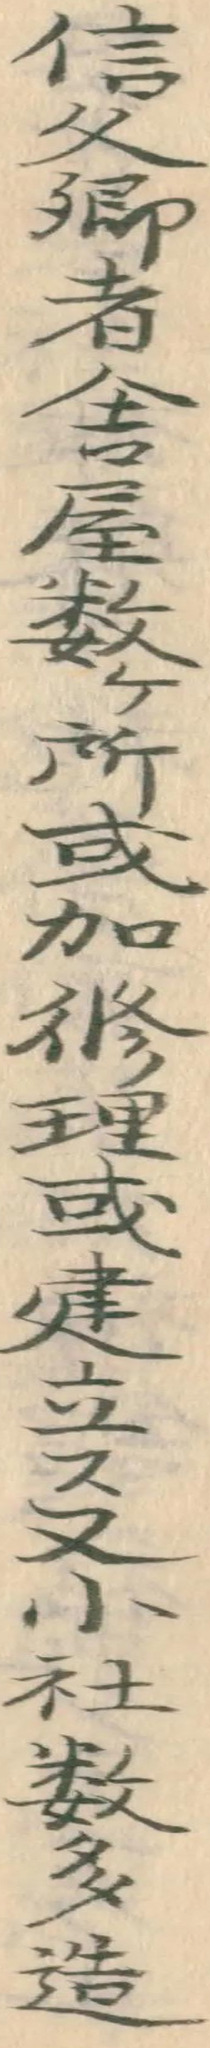信久卿者舎屋数ケ所或加修理或建立ス又小社数多造
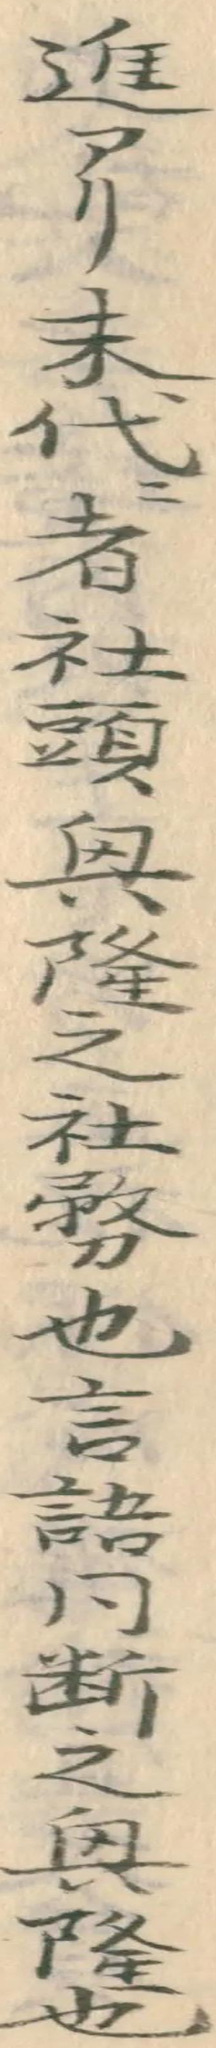進アリ末代ニ者社頭興隆之社務也言語同断之興隆也
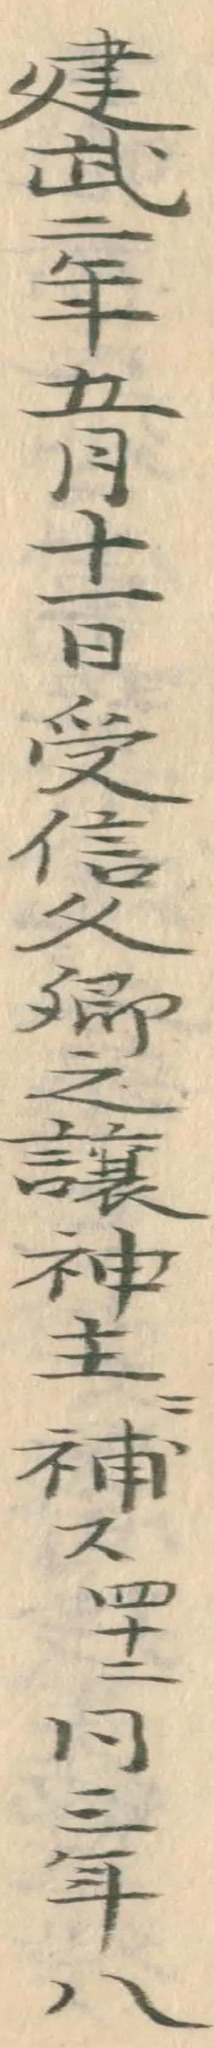建武二年五月十一日受信久卿之譲神主ニ補ス四十二同三年八
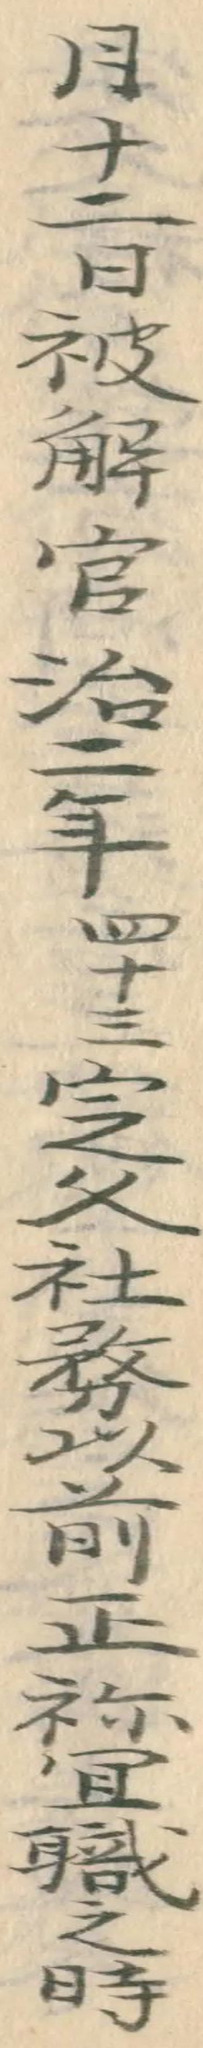月十二日被解官治二年四十三定久社務以前正祢宜職之時
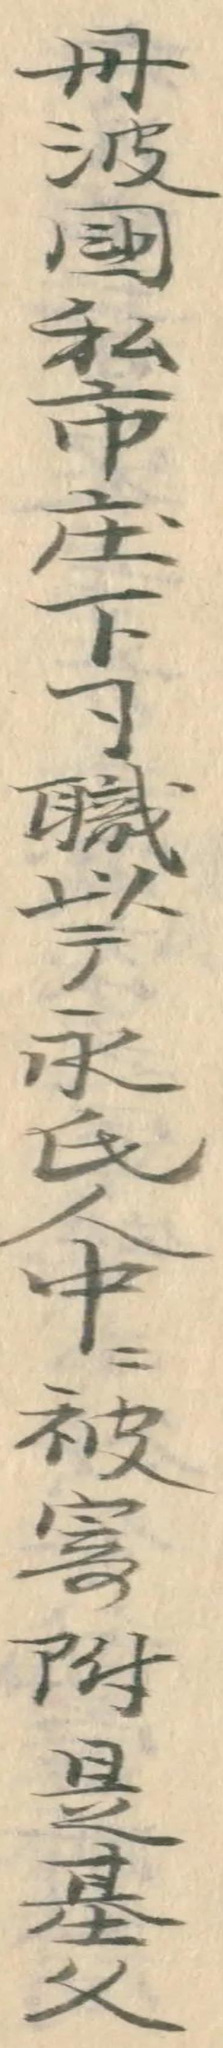丹波国私市庄下司職以テ永氏人中ニ被寄附是基久
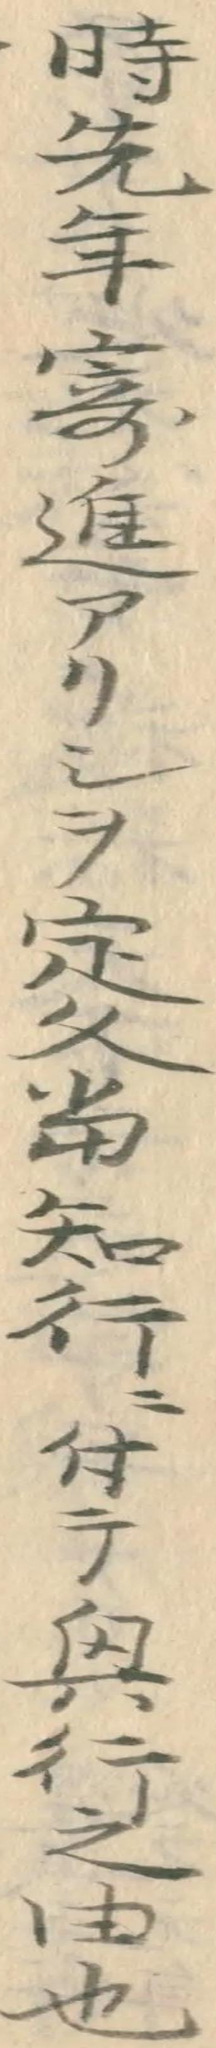時先年寄進アリシヲ定久当知行ニ付テ興行之由也
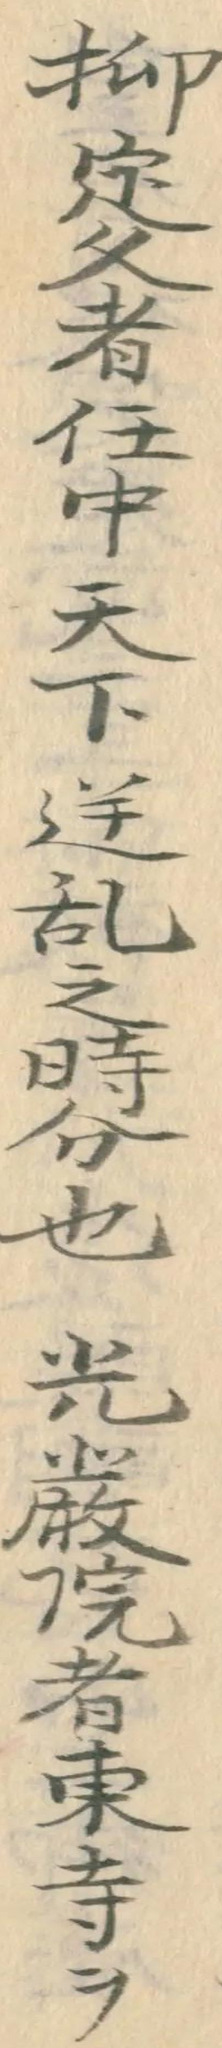抑定久者任中天下逆乱之時分也光巌院者東寺ヲ

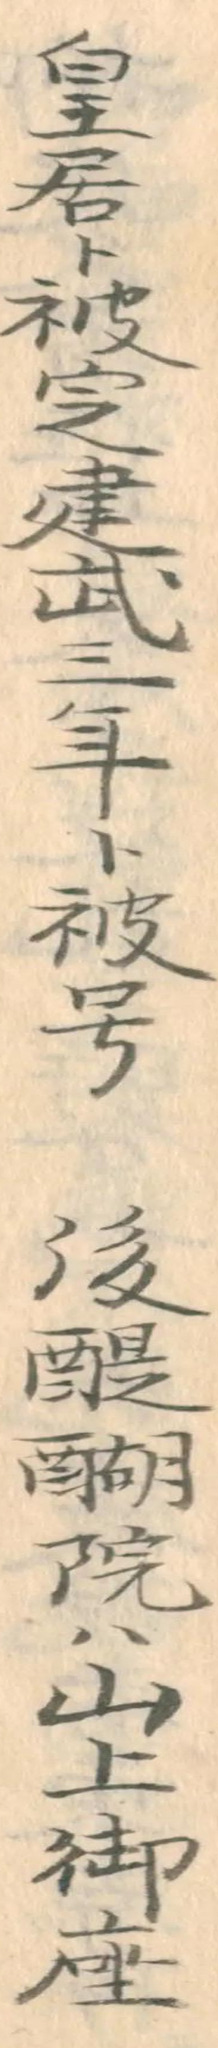皇居ト被定建武三年ト被号後醍醐院ハ山上御座
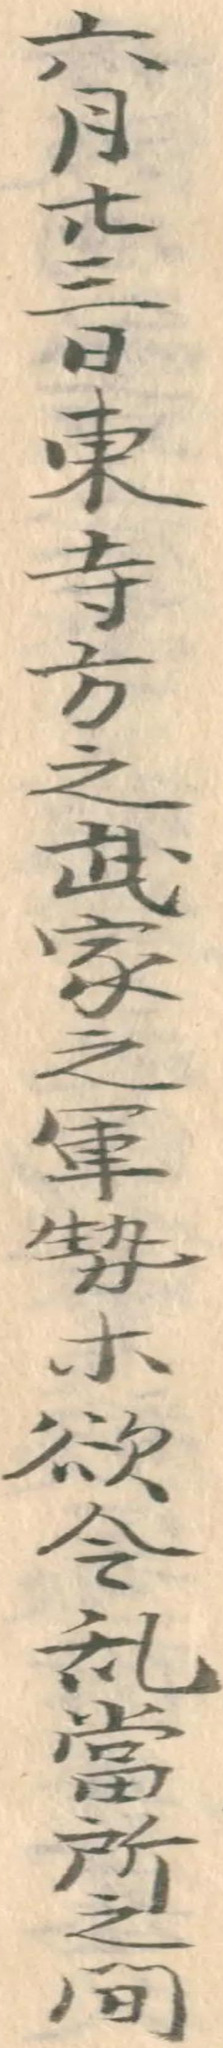六月廿三日東寺方之武家之軍勢等欲令乱当所之間
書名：賀茂社記録. 第24冊
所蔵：国立国会図書館 National Diet Library, JAPAN
